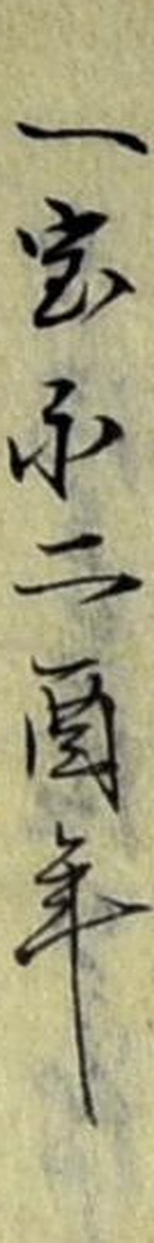一宝永二酉年

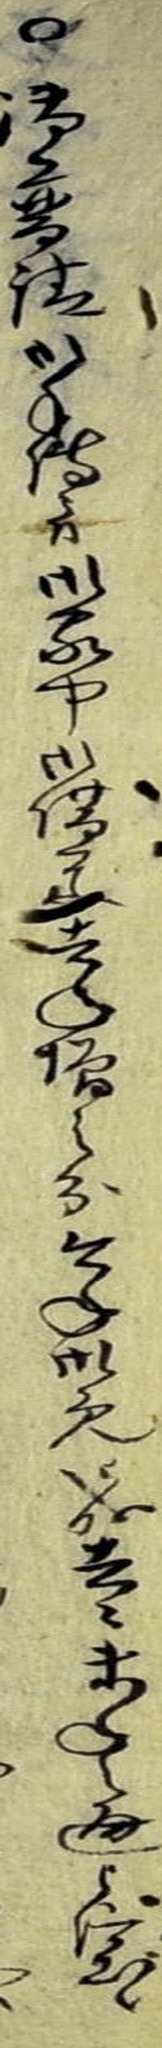〇御普請御手伝ニ付御家中御借米去年増之分今年御免被成去々未年之通被仰出候
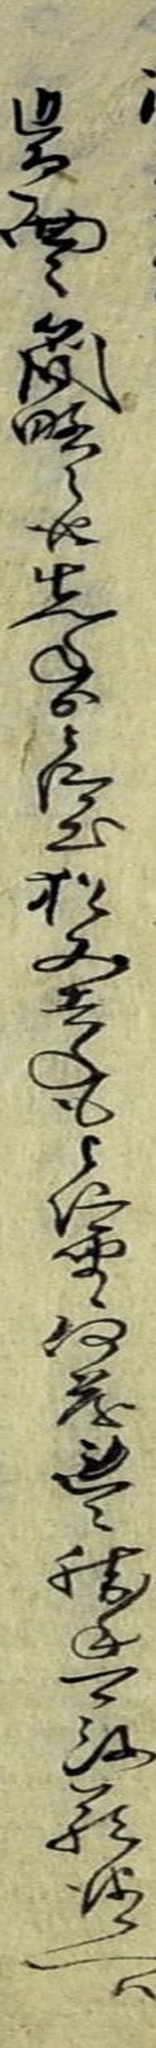追而面々簡略之儀先年ゟ被仰出猶以去年も被仰聞候何茂連々勝手可致難儀候ヘハ
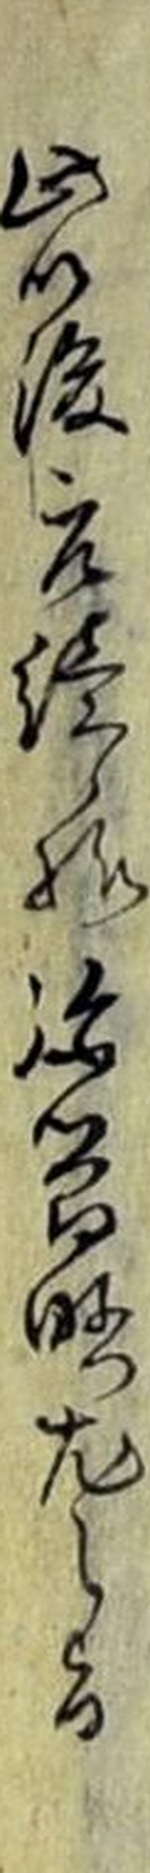此以後取続候様弥簡略尤之旨
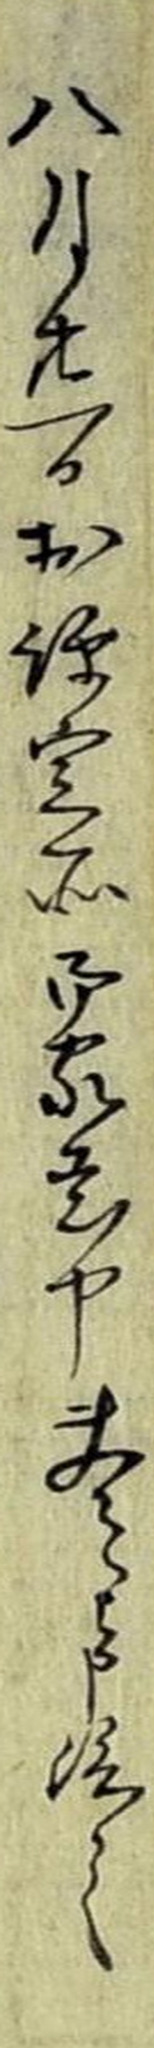八月廿一日於評定所御家老中夫々へ被申渡之
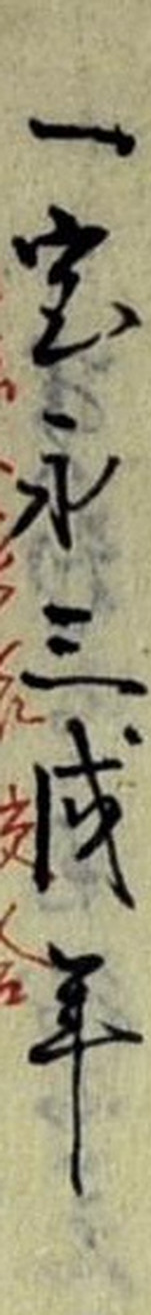一宝永三戌年
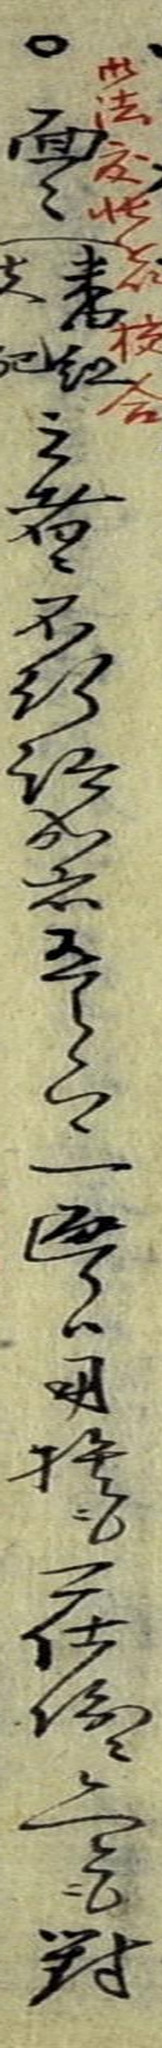支配之者ニ不行跡成者有之候ハヽ一通りハ用捨ニも可仕儀ニ候へとも対
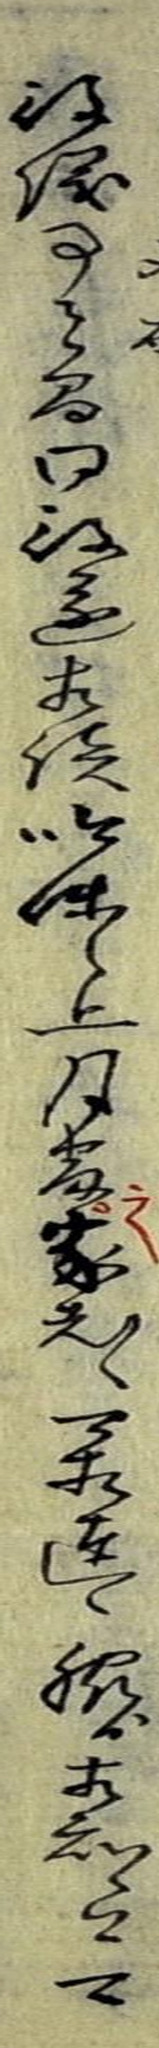役儀事ニ候間同役遂相談吟味之上月番之家老へ可相達候脇ゟ相知候ハヽ可
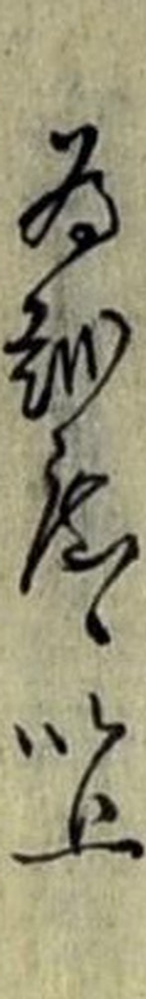為越度候以上
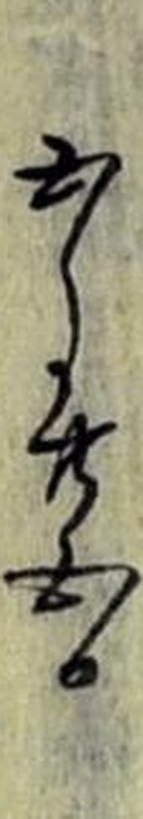二月廿八日
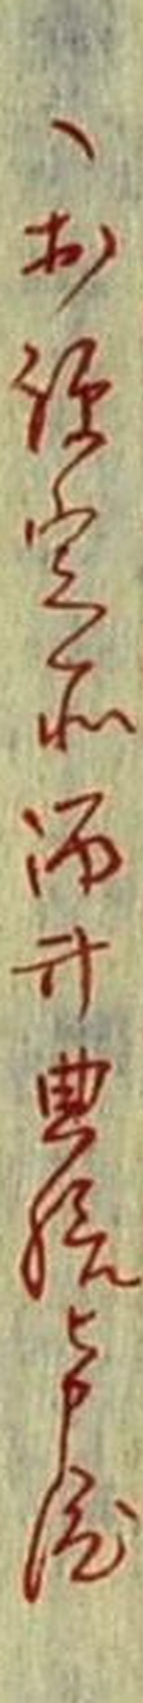へ於評定所酒井典膳被申渡
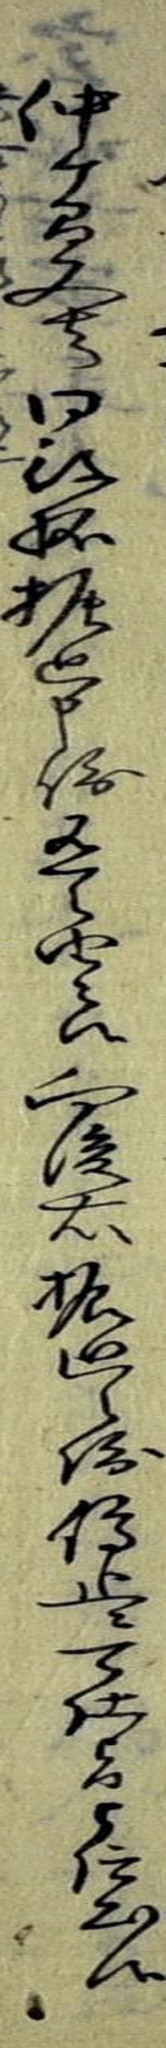仲ケ間又者同役抔振廻申儀有之由ニ候向後右振廻之儀停止ニ可仕旨被仰出候
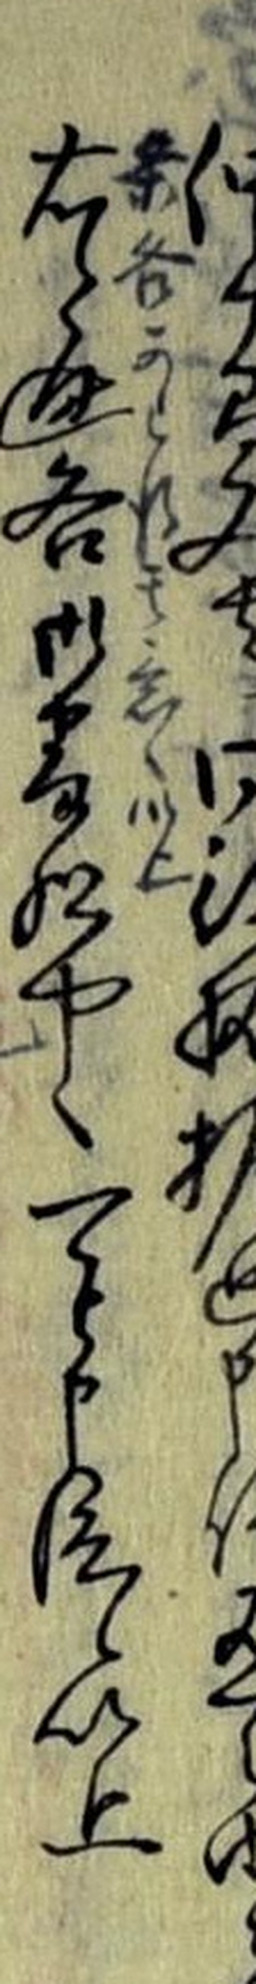右之通各御番組中へ可被申渡候以上
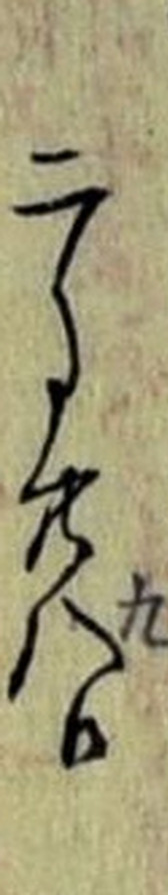二月廿八日
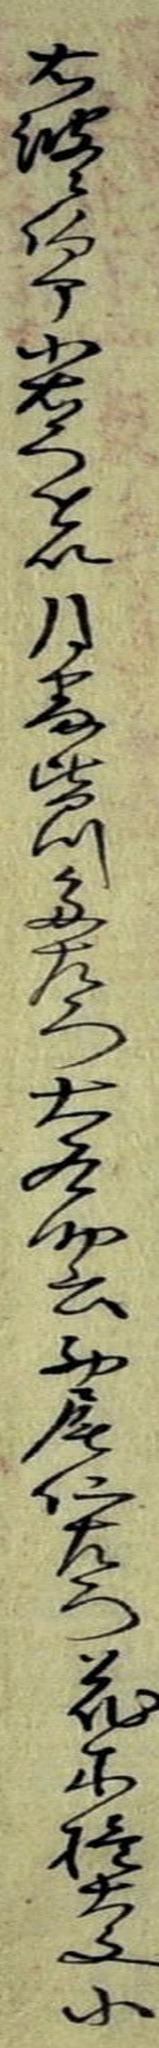右波々伯部小右衛門を以月番皆川多左衛門大谷助六西尾仁左衛門花木権大夫小
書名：命令之部 一
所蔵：福井県文書館 Fukui Prefectural Archives
